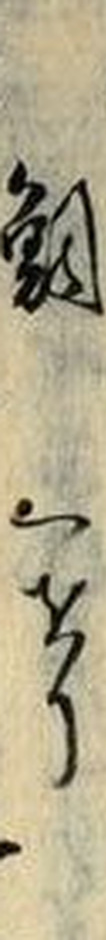鯛一をり
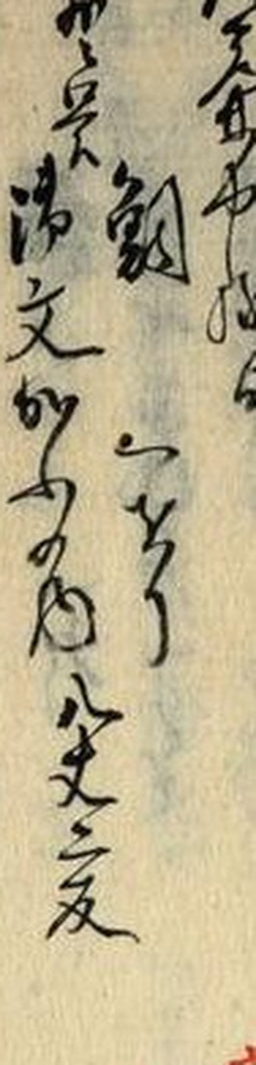御文かふの内八丈二反
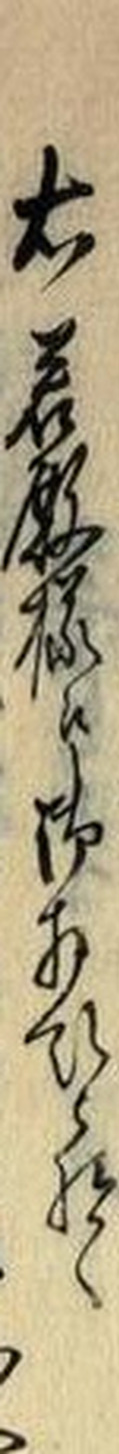右若殿様江御拝領被遊候
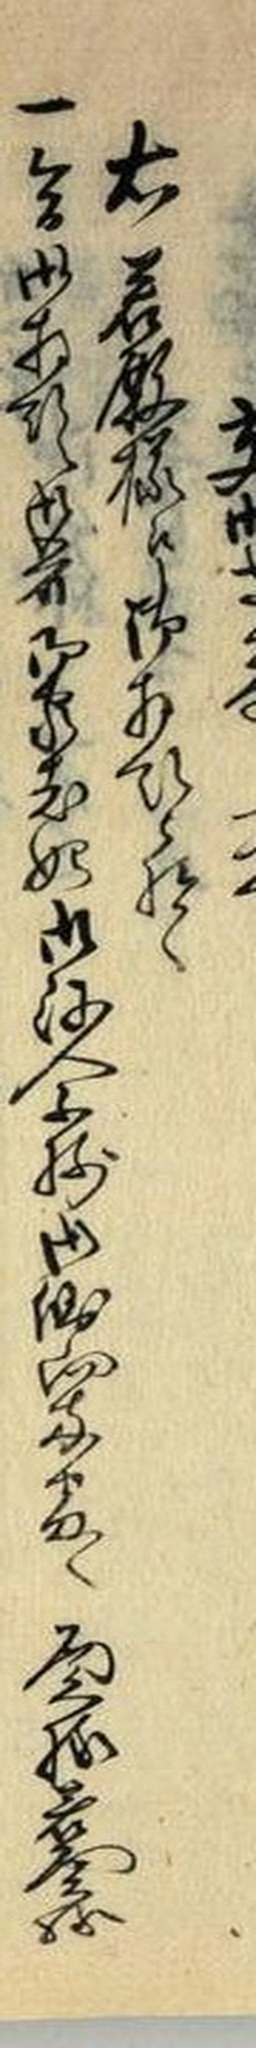一今日御拝領候御肴御家老始御役人不残御側向両番へ殿様若殿様
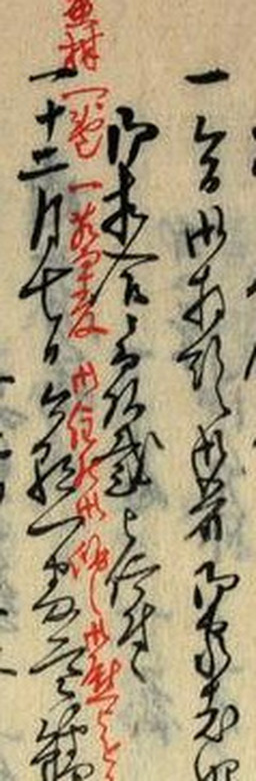御相合ニ而頂戴被仰付候
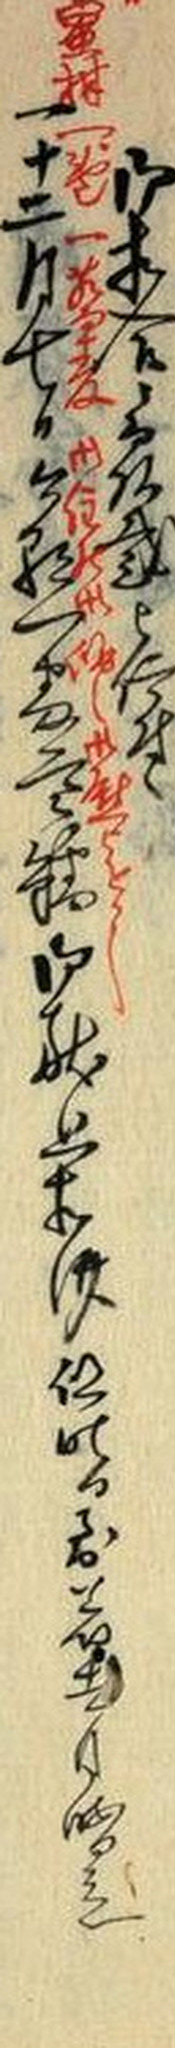一十二月七日今朝一番寒鱈御献上相済但昨日到着去月晦日立
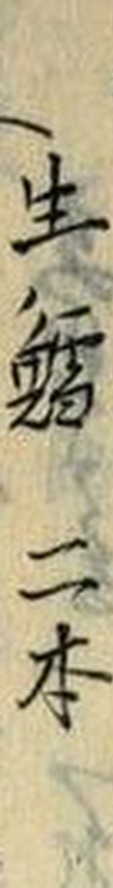生鱈二本
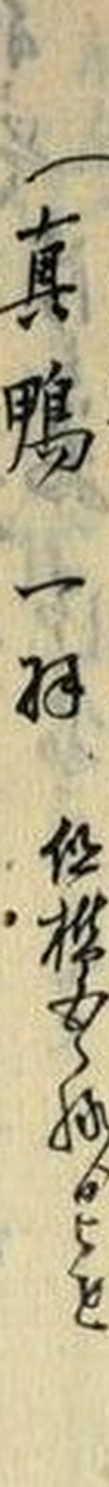真鴨一羽但楷五郎様ゟ被進
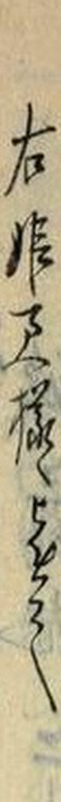右姫君様へ被進之
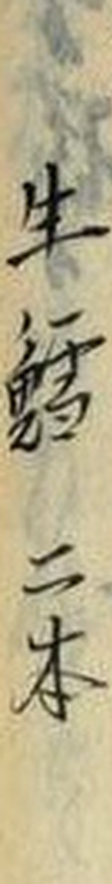生鱈二本
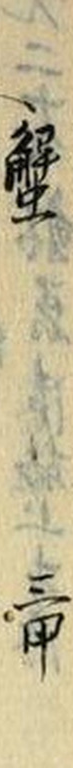蟹三甲
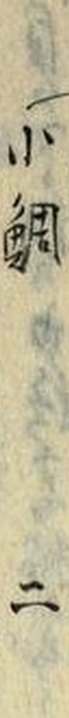小鯛二
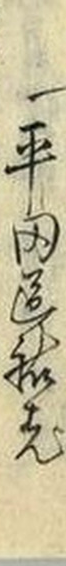平田道祐老
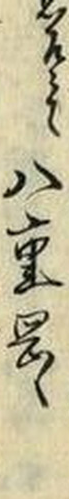八重岡へ
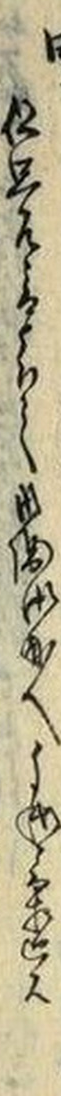但思召ニ而被下之御側御用人手紙ニ而相廻ス
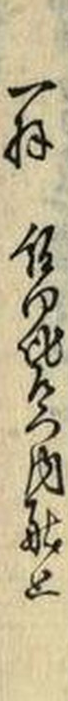同一羽飯田作左衛門内献上
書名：少傅日録抄（斉承付側向頭取日記、在府）
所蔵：福井県文書館 Fukui Prefectural Archives
